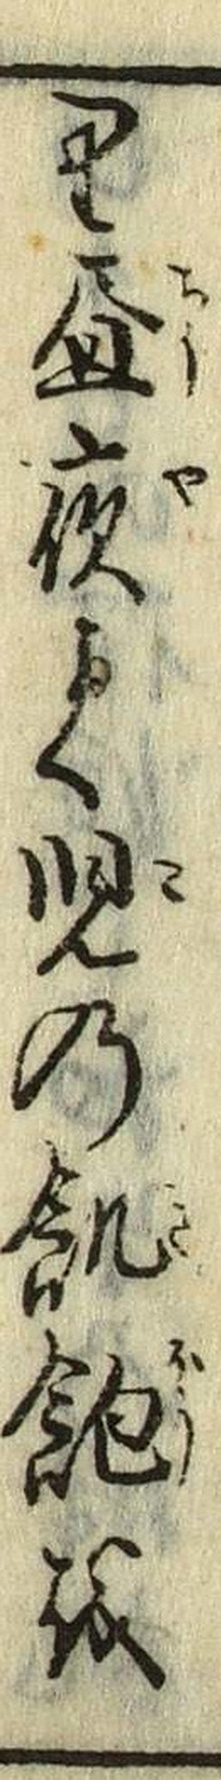り昼夜よく児の飢飽を
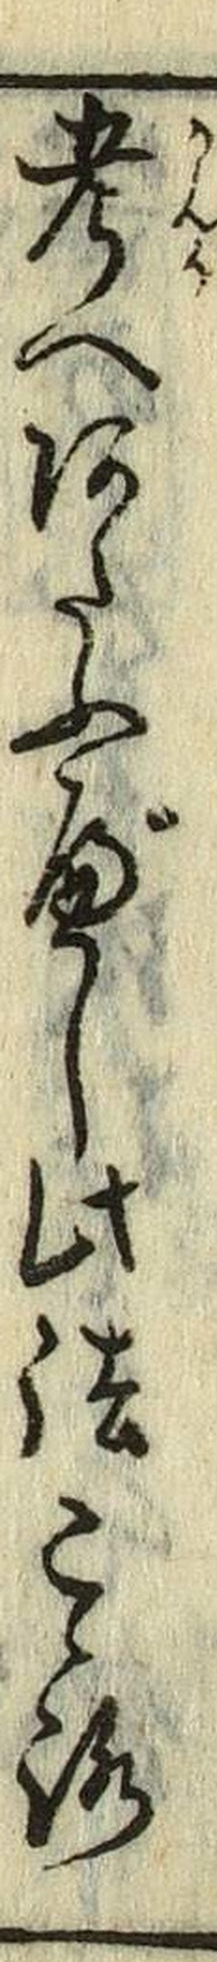考へあたふべし此法こゝろ
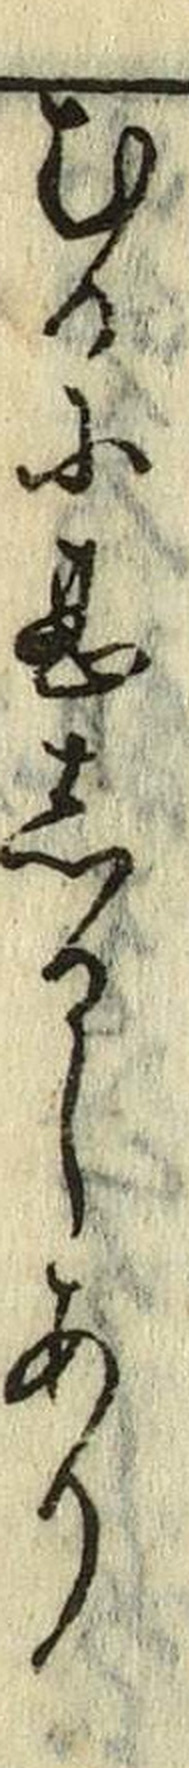むるに甚しるしあり
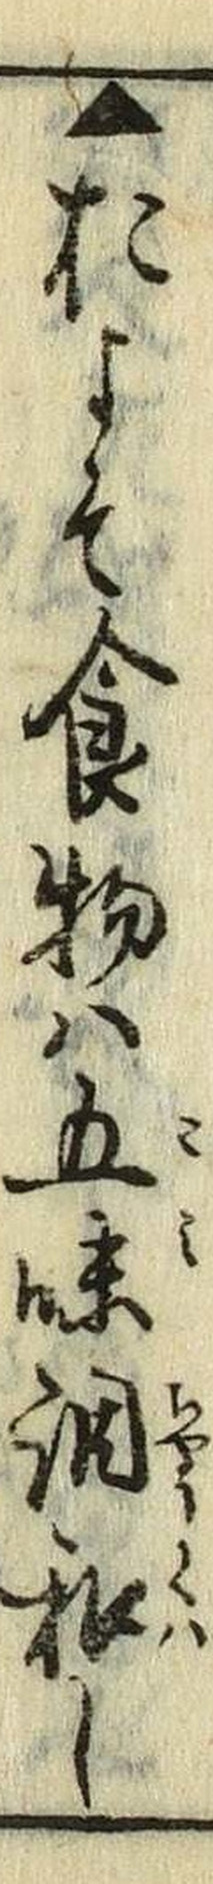▲およそ食物は五味調和し
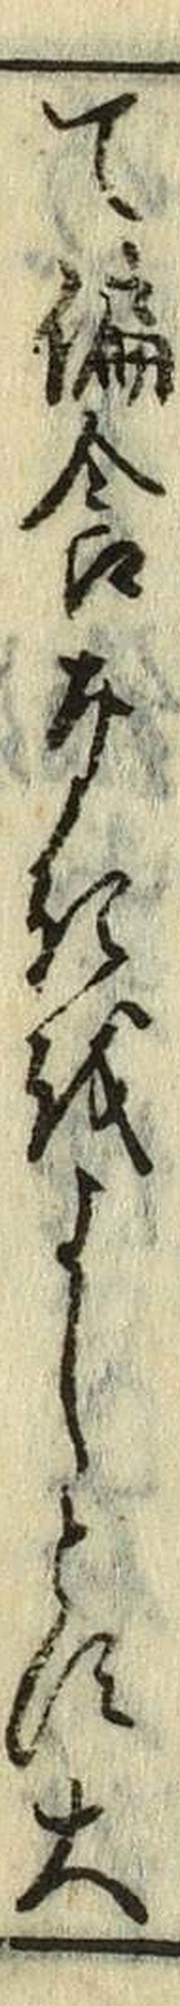て偏食なきをよしとす大
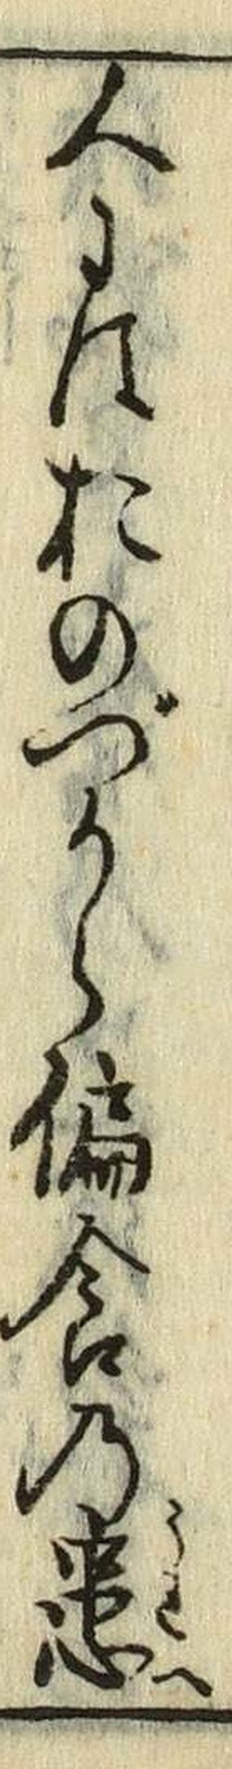人にはおのづから偏食の患
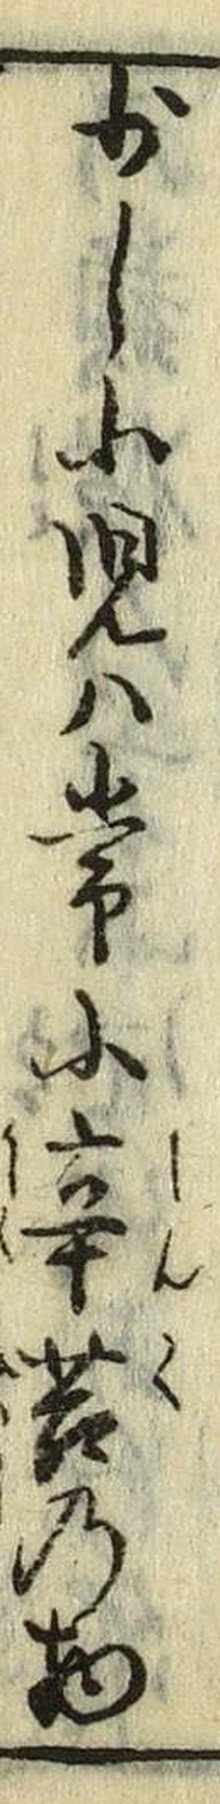少し小児は常に辛苦の物
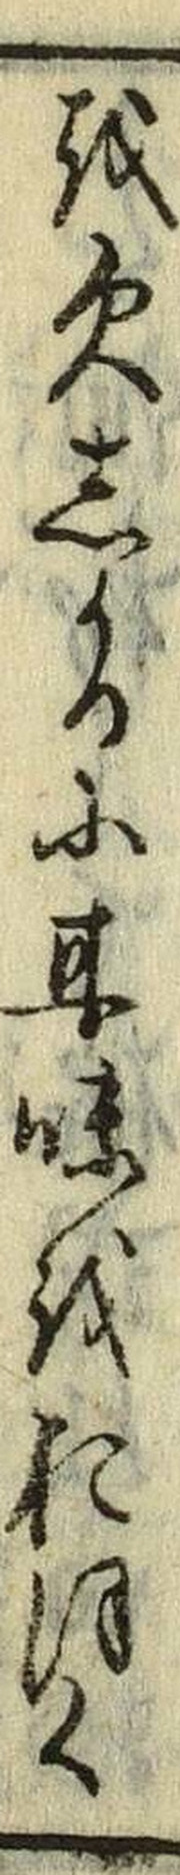を欠しかるに甘味をおほく
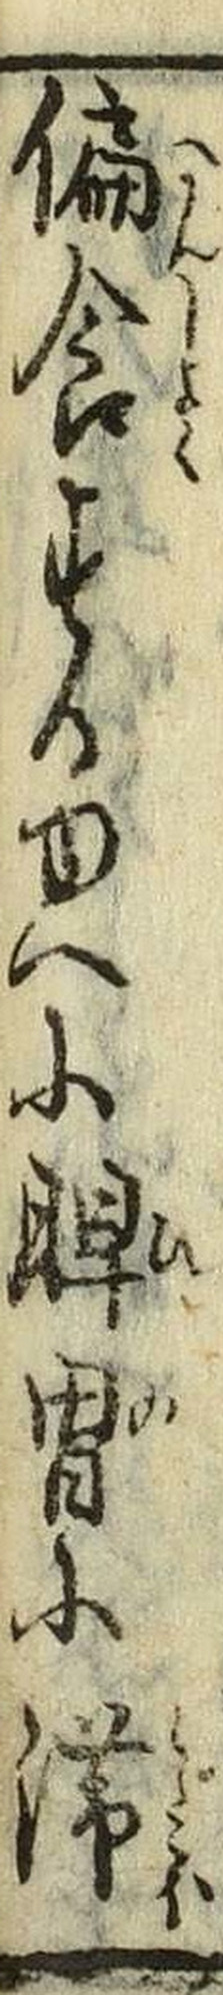偏食するゆへに脾胃に滞
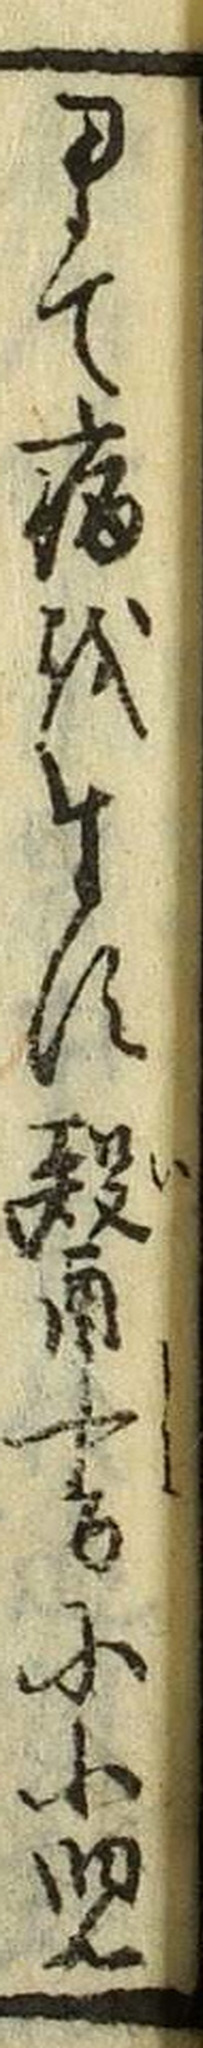りて病を生す医書に小児
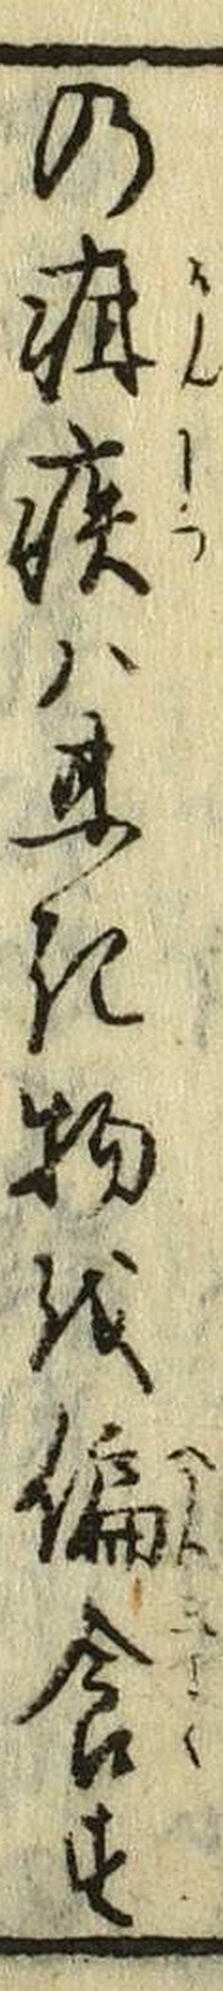の疳疾は甘き物を偏食す
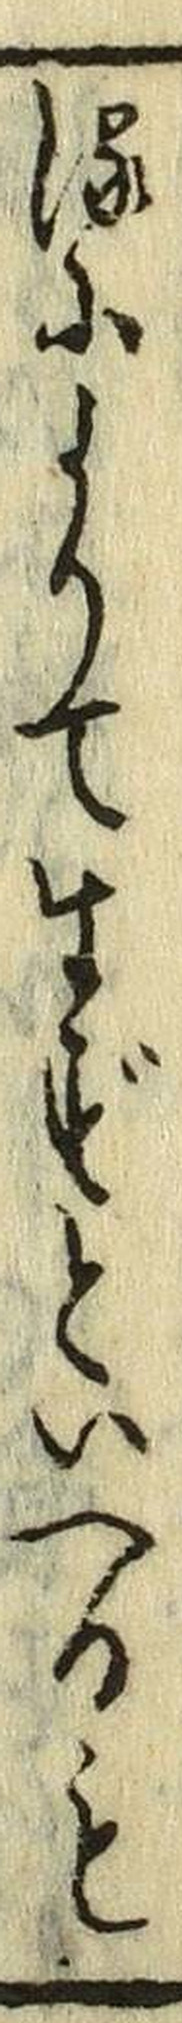るによりて生ずといへるも
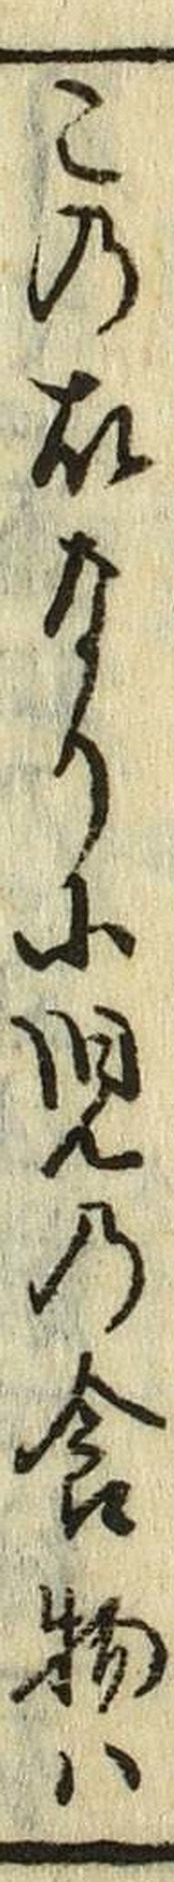この故なり小児の食物は
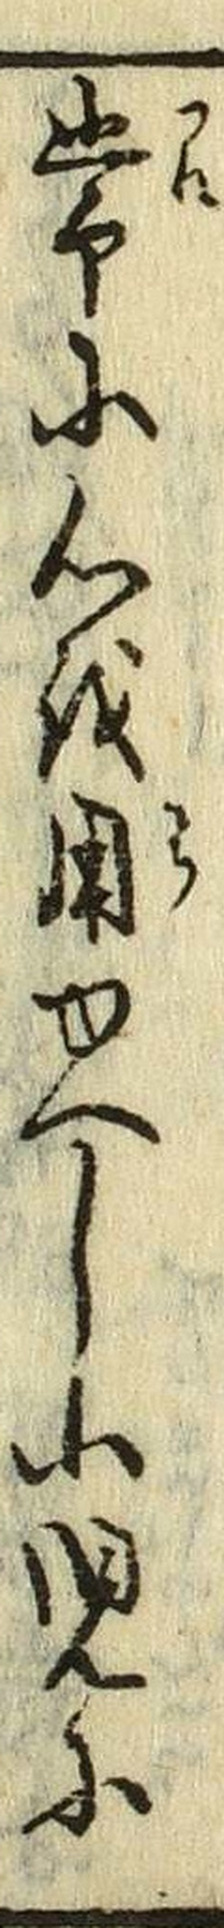常に心を用ゆへし小児に
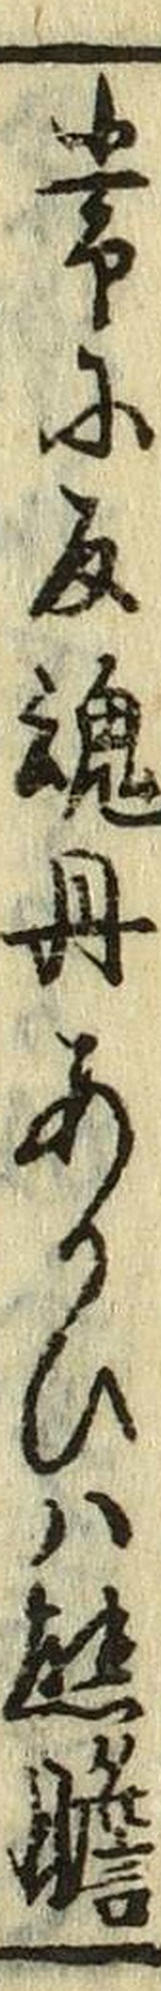常に反魂丹あるひは熊胆
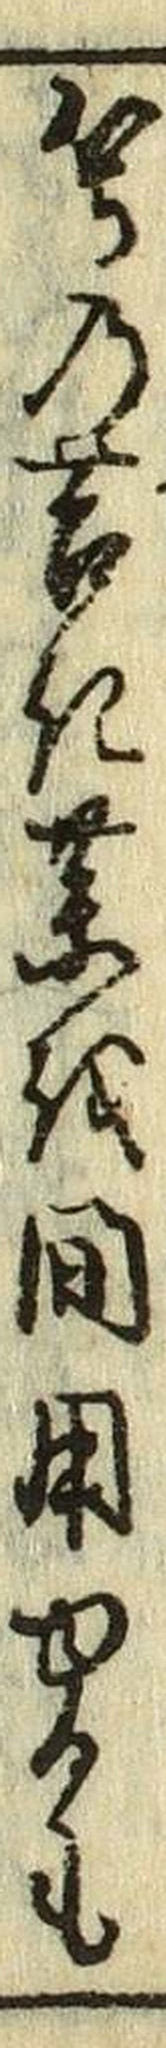等の苦き薬を間用ゆるも
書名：居家養生記
